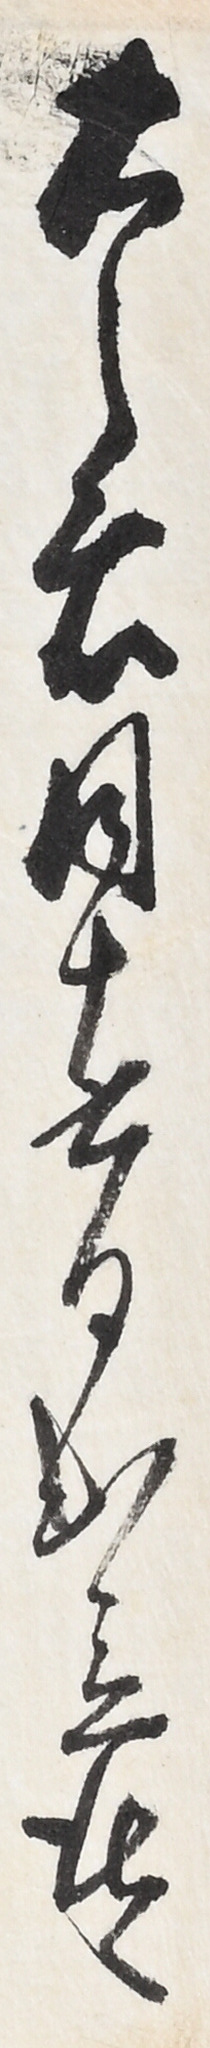右之者同十六日出立仕候
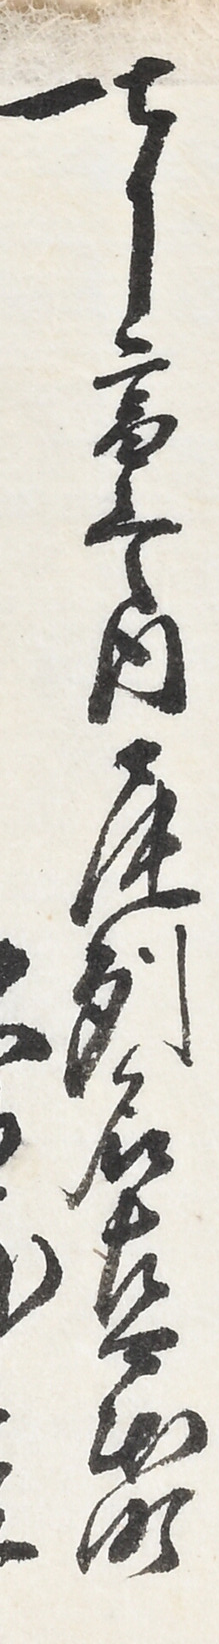七月書上之内尾州名古屋本町
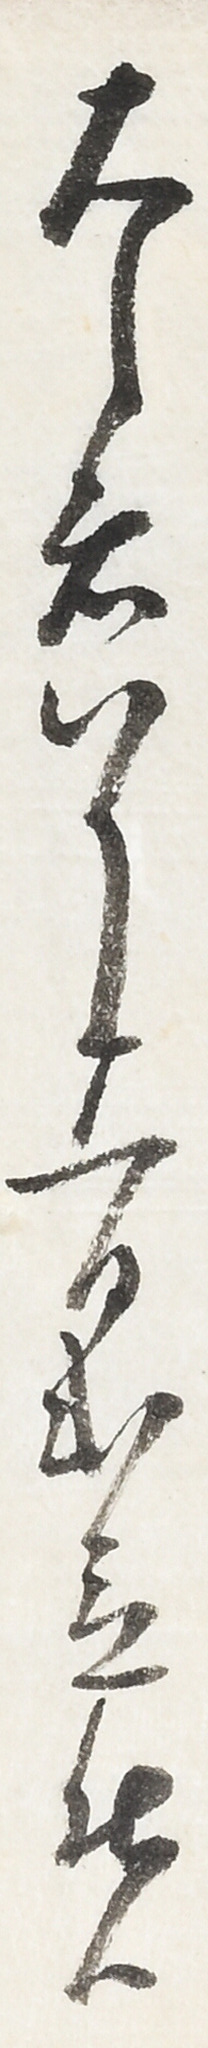右之者八月十一日出立仕候
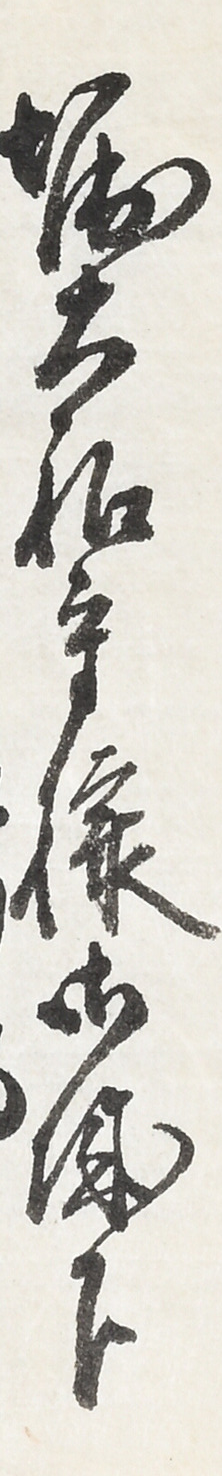堀大和守様御城下
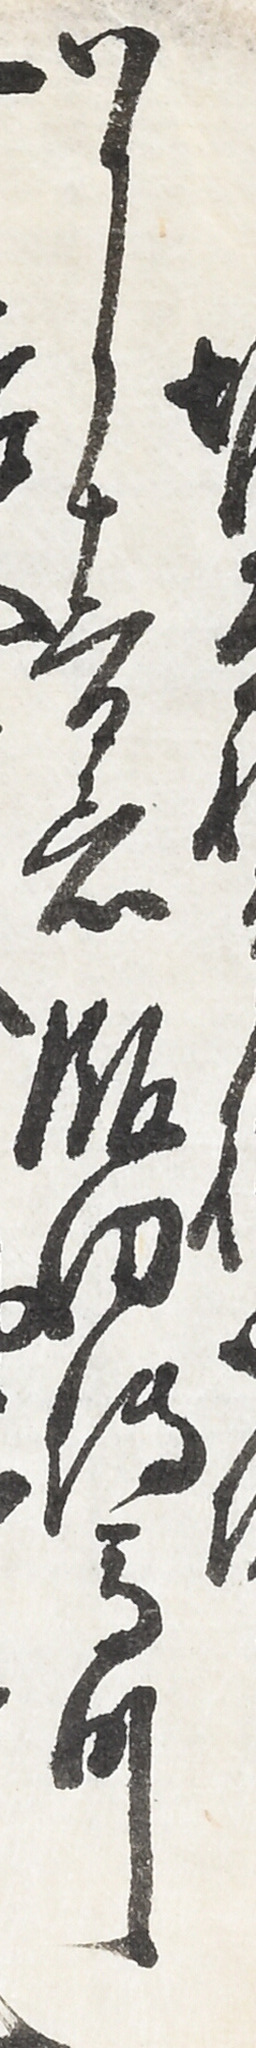八月十二日着飯田伝馬町
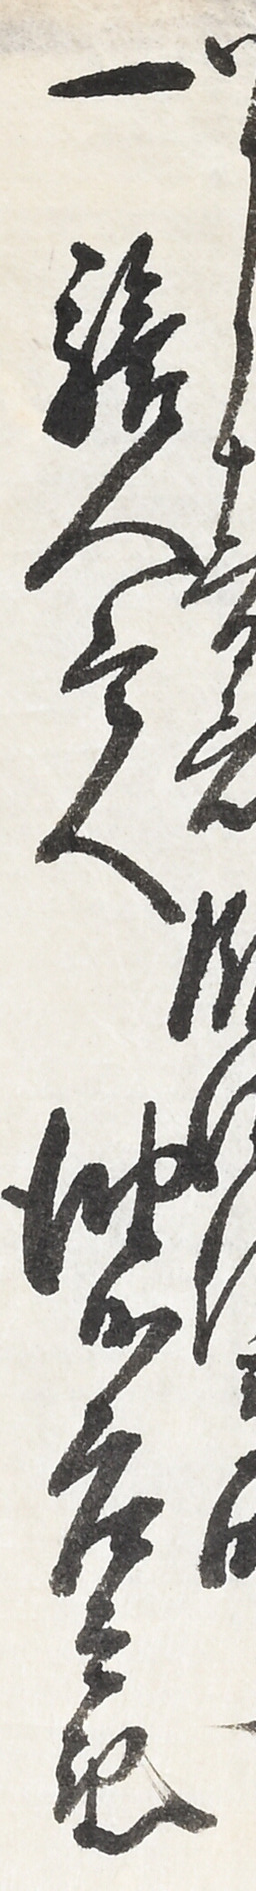一旅人壱人油や吉兵衛
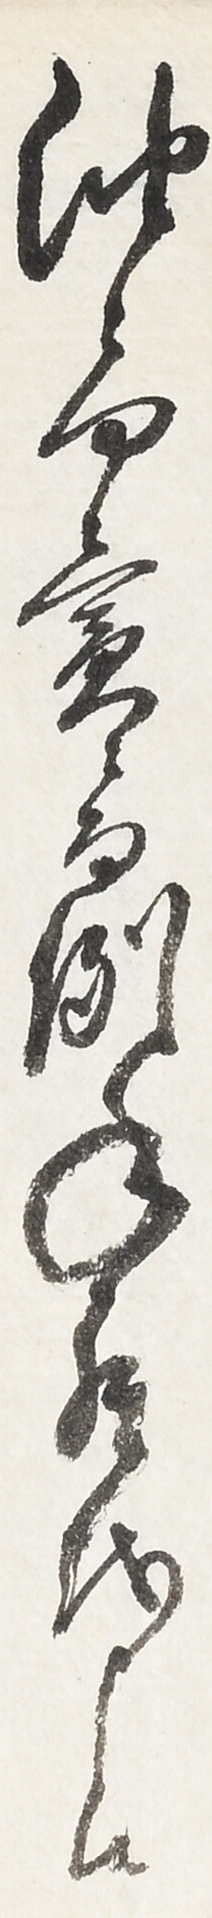油商売ニ而例年罷越申候
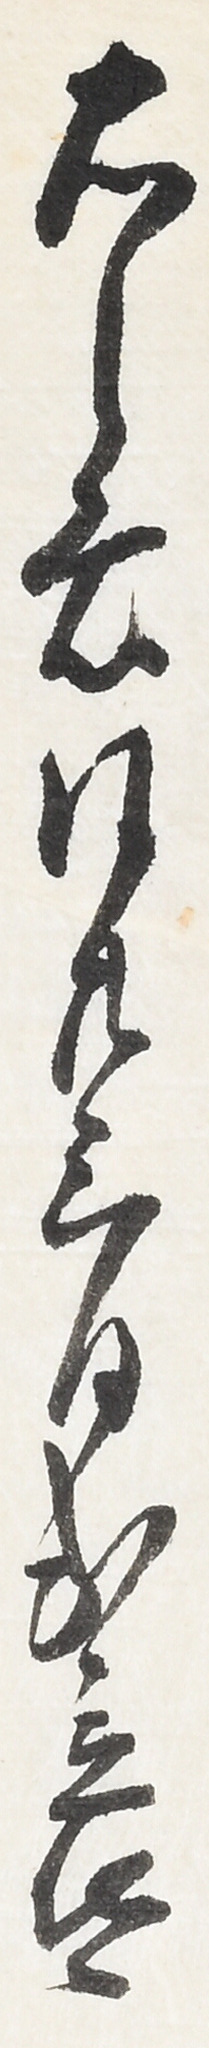右之者同廿三日出立仕候
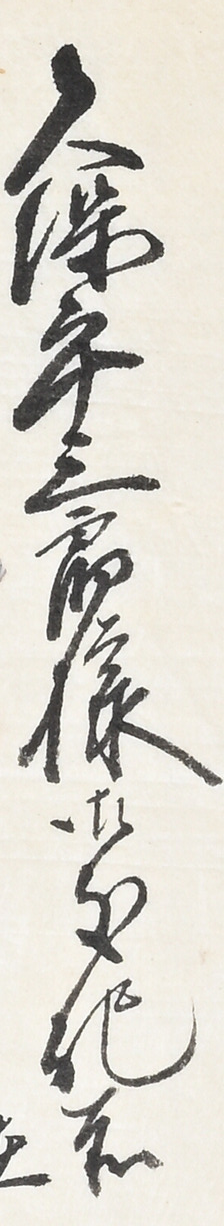久保平三郎様御支配所
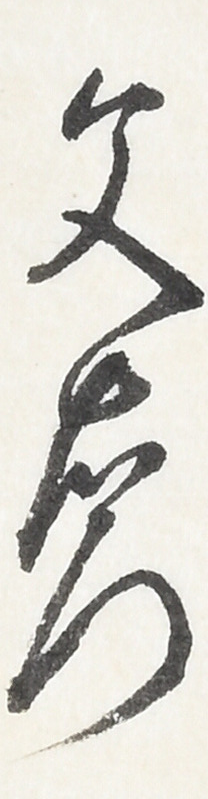文右衛門
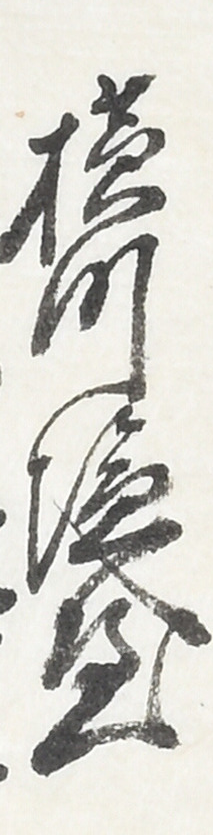横町塩屋
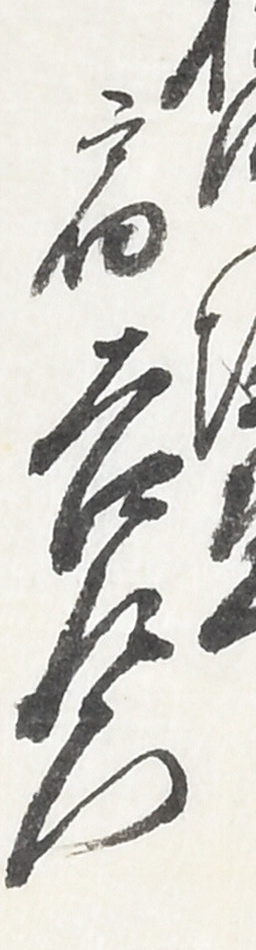宿吉左衛門
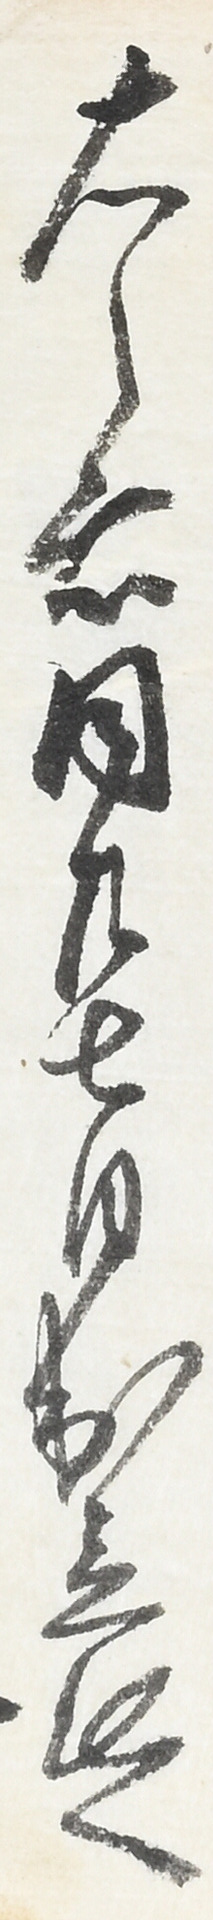右之者同廿七日出立仕候

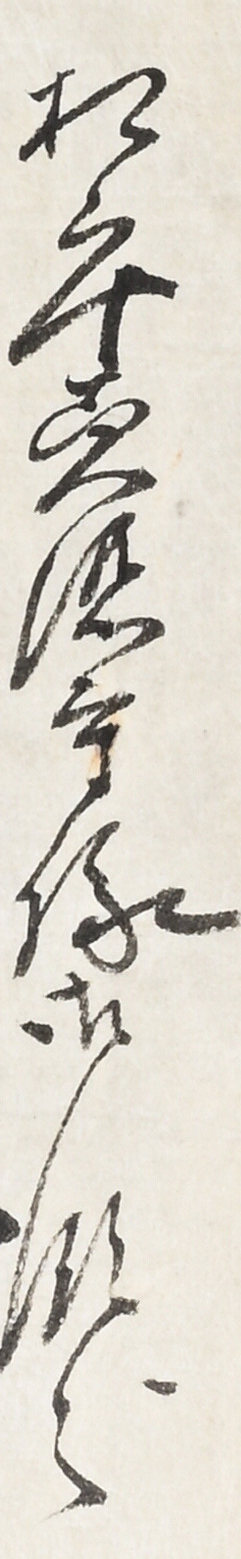松平美濃守様御領分
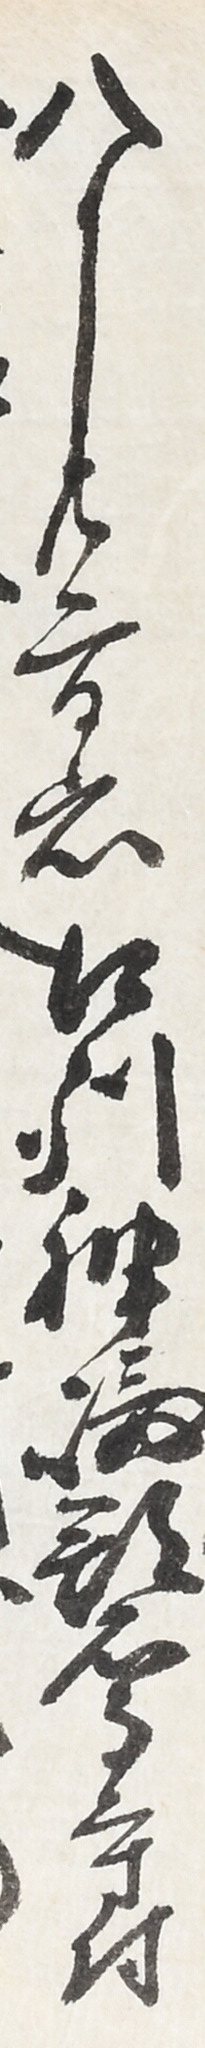八月廿二日着江州神崎郡石馬寺村
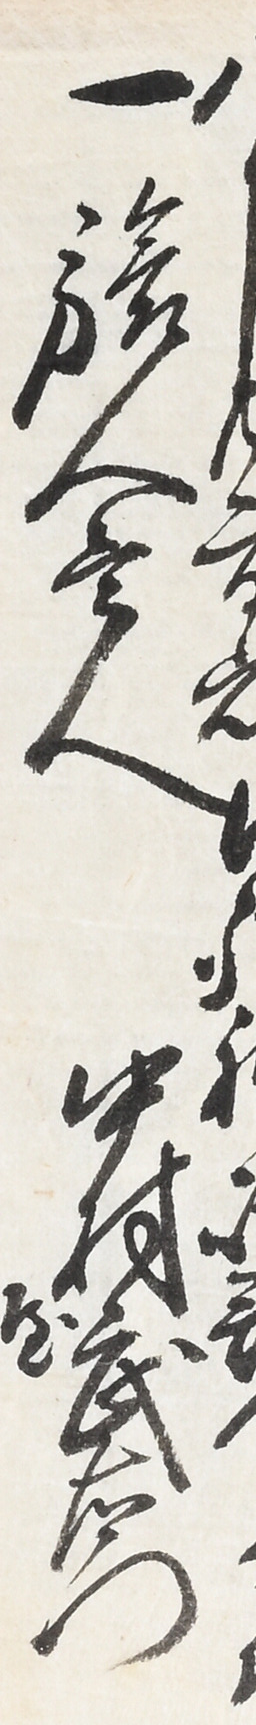一旅人壱人中村武右衛門
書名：旅人泊控帳
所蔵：伊那市立高遠町図書館・合同会社AMANE
